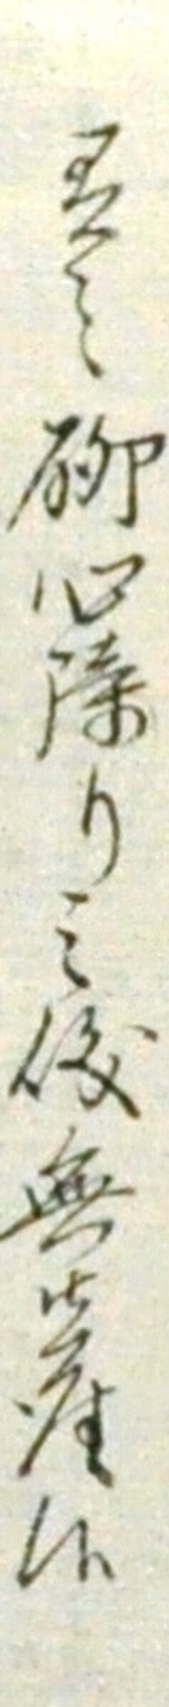有之聊心障り之儀無御座候
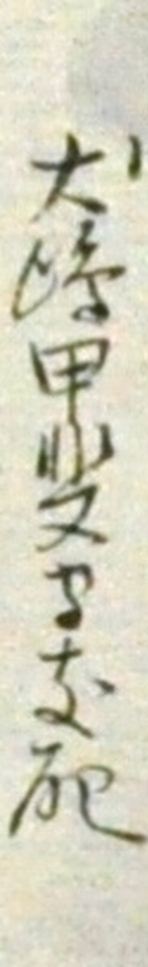大島甲斐守支配
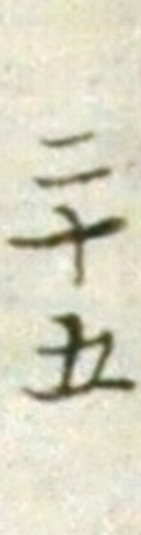二十五
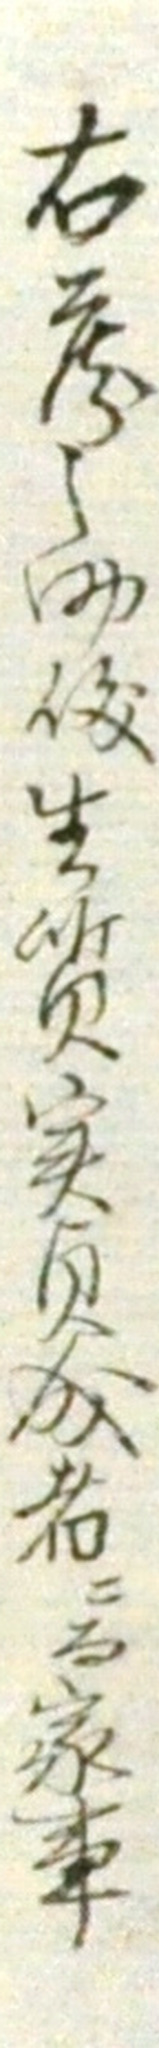右蔵之助儀生質実貞成者にて家事
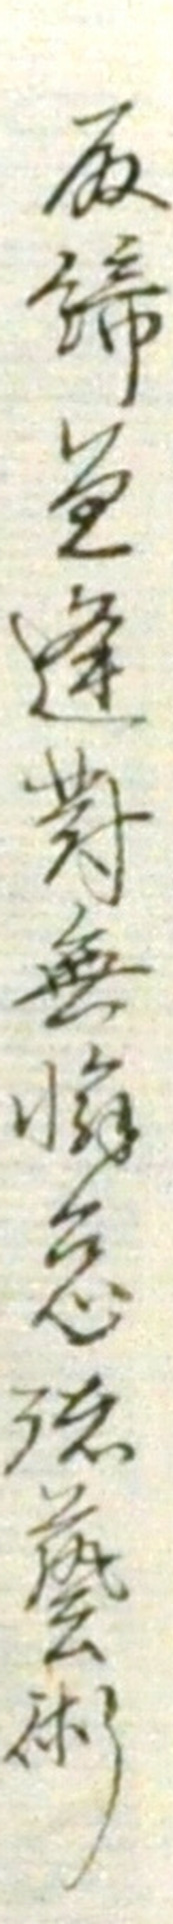取締宜逢対無懈怠諸芸術
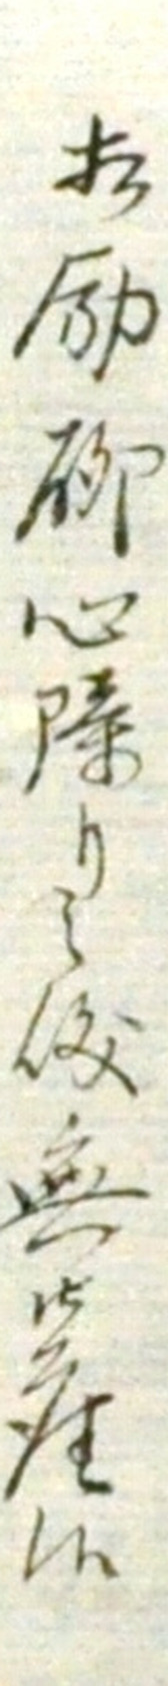相励聊心障り之儀無御座候
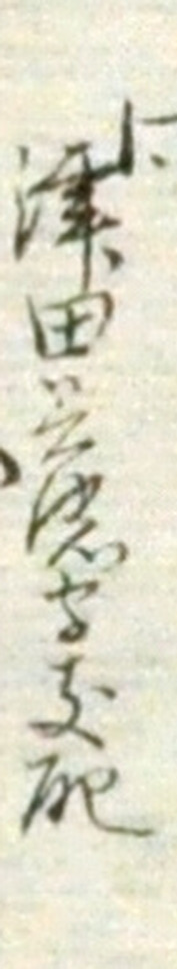津田美濃守支配
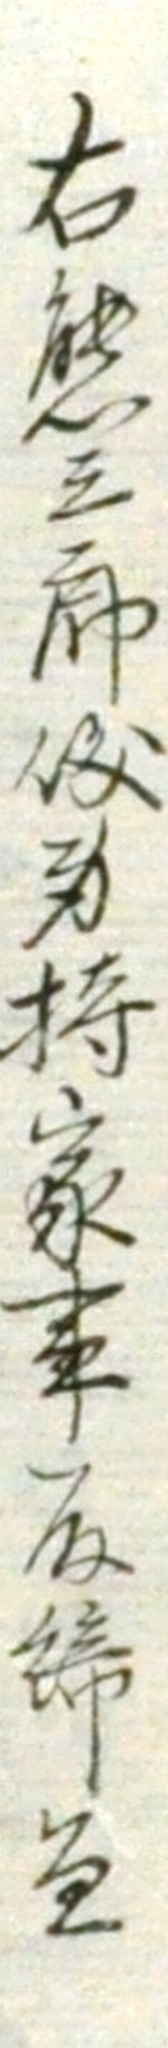右熊三郎儀身持家事取締宜
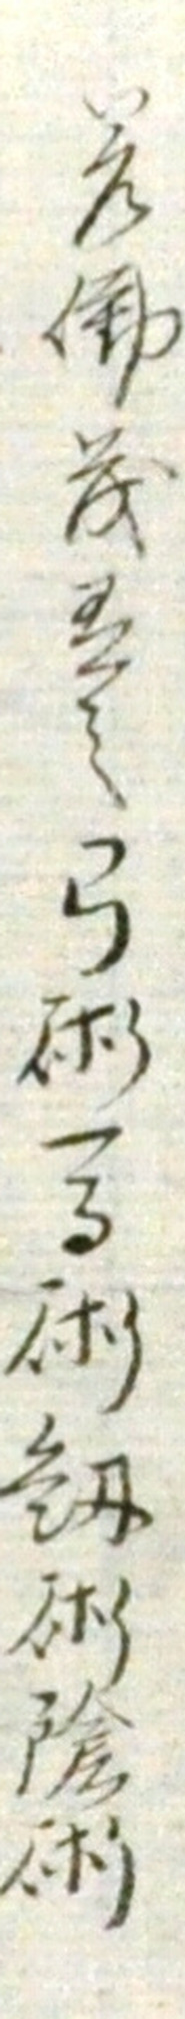差働も有之弓術馬術剣術鎗術
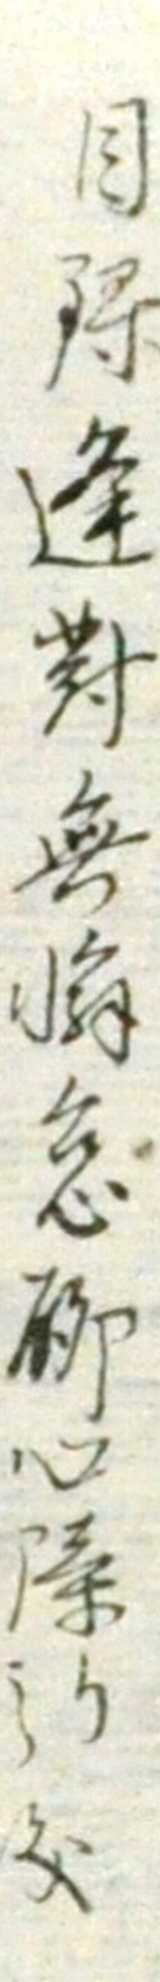目録逢対無懈怠聊心障り之儀
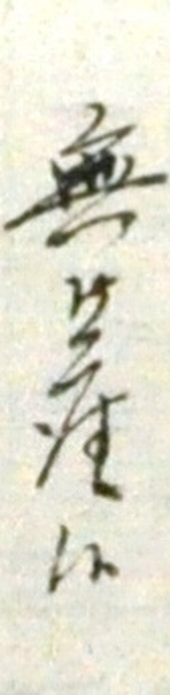無御座候
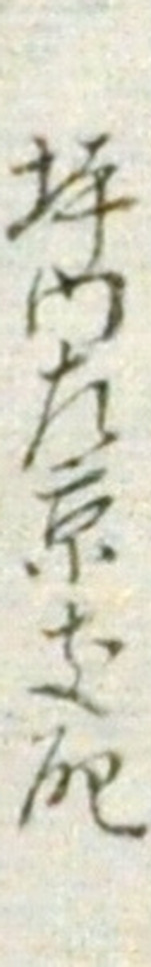坪内左京支配
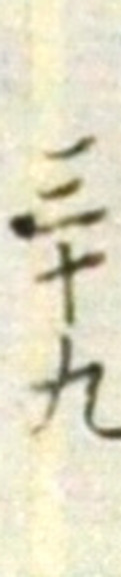三十九
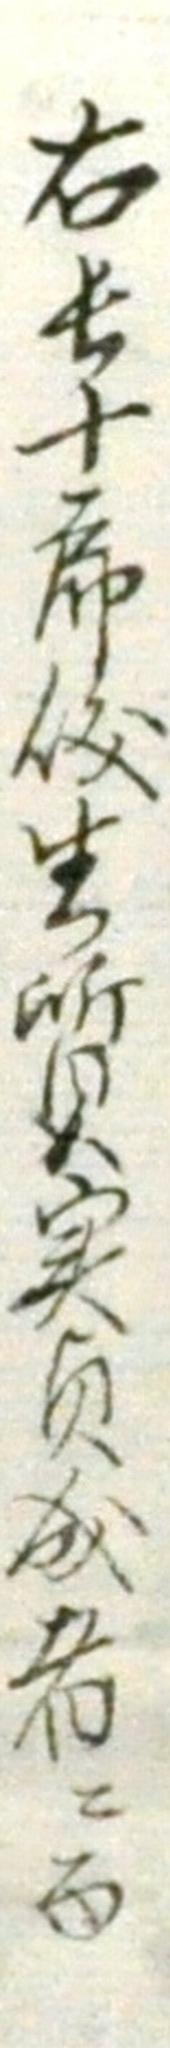右長十郎儀生質実貞成者にて
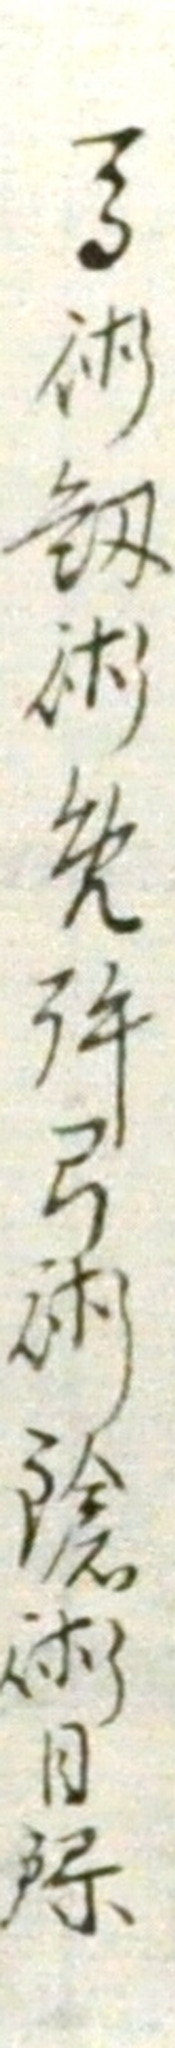馬術剣術免許弓術鎗術目録
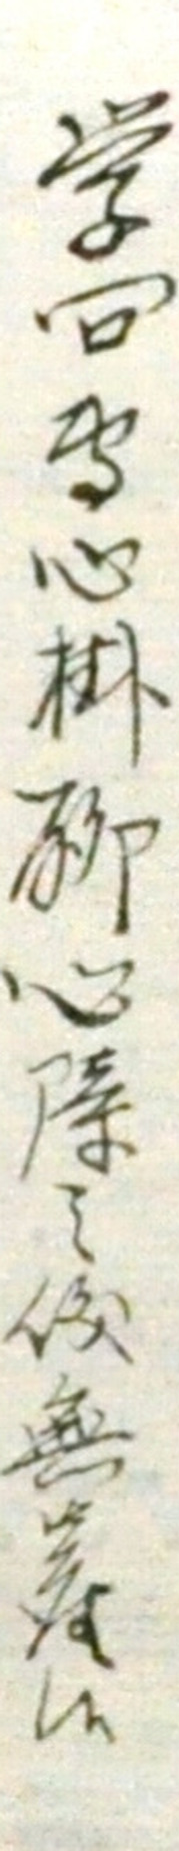学問専心掛聊心障之儀無御座候
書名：右大将様御書院番御入人調
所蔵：伊那市立高遠町図書館・合同会社AMANE
